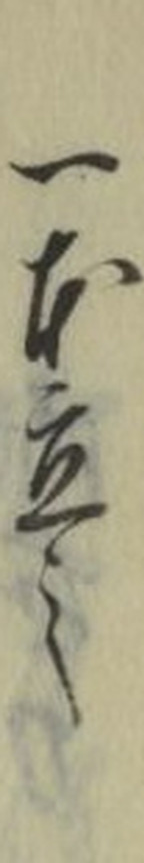一本立之
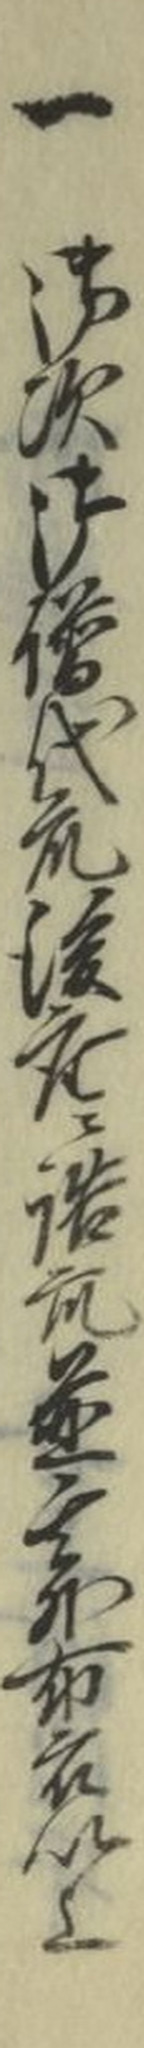一御次御譜代衆後座に詰衆並其外布衣以上
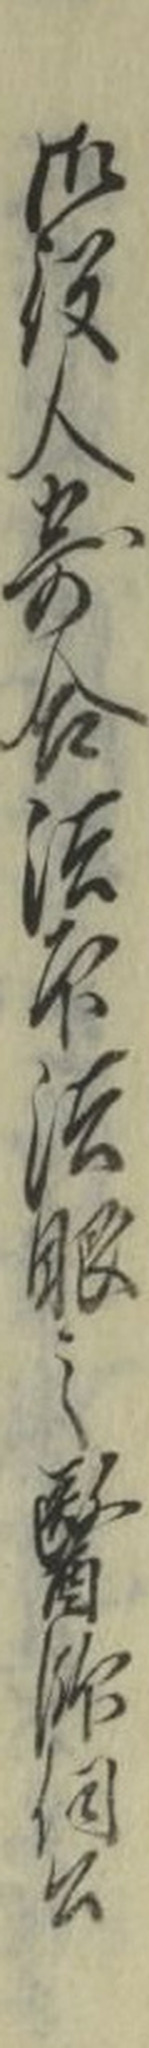御役人寄合法印法眼之医師伺公
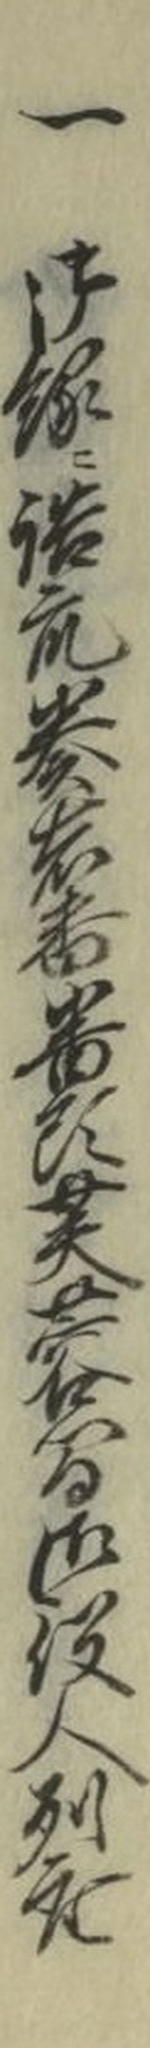一御縁に詰衆奏者番番頭芙蓉間御役人列座
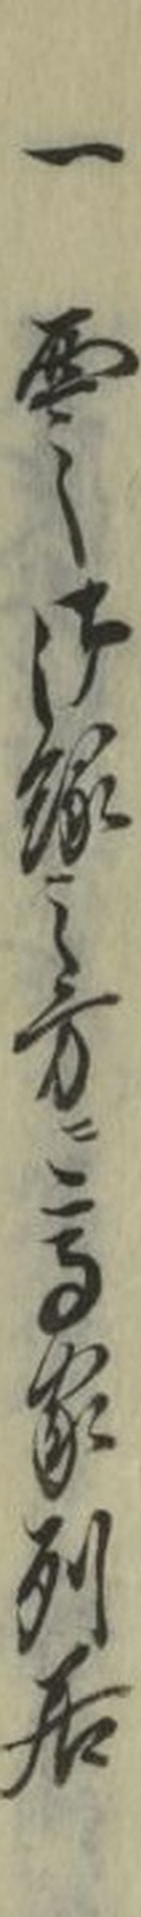一西之御縁之方に高家列居
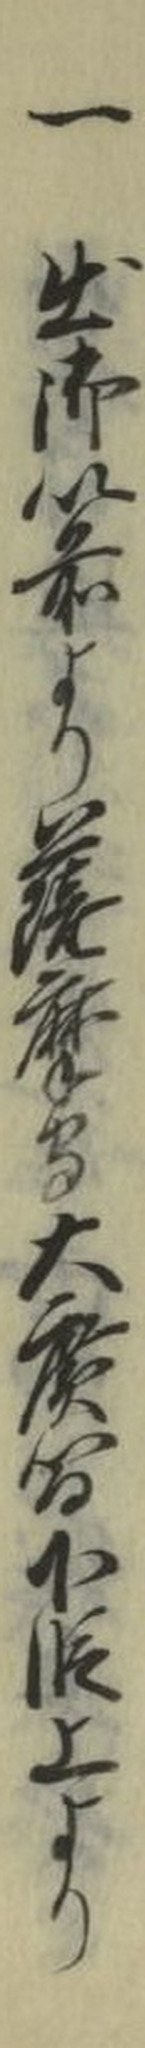一出御以前より薩摩守大広間下段上より

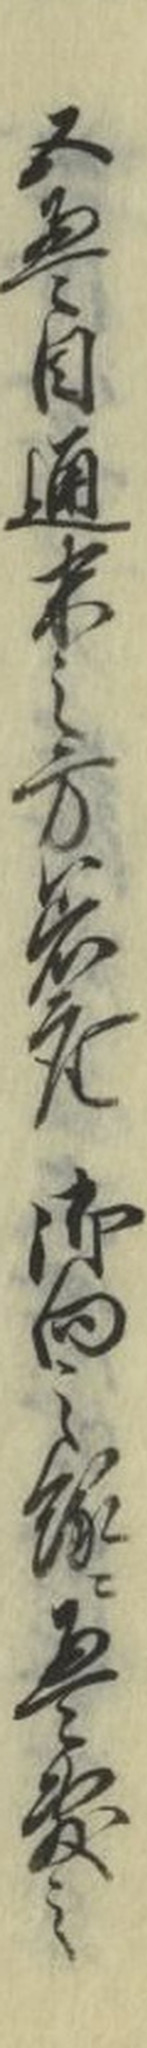五畳目通末之方着座御向之縁に畳敷之
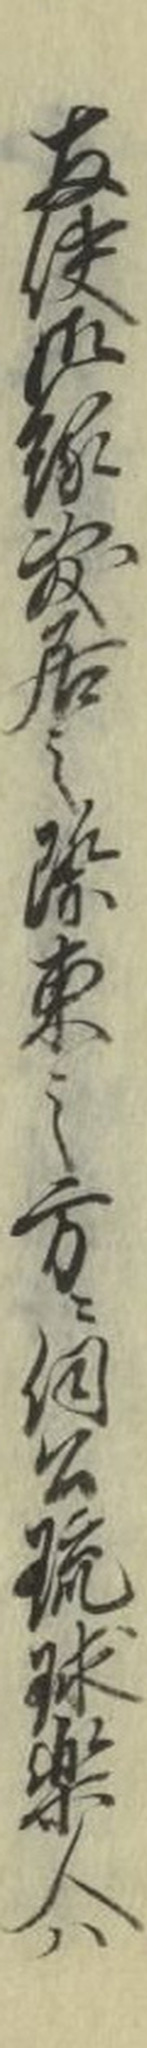両使御縁敷居之際東之方に伺公琉球楽人は
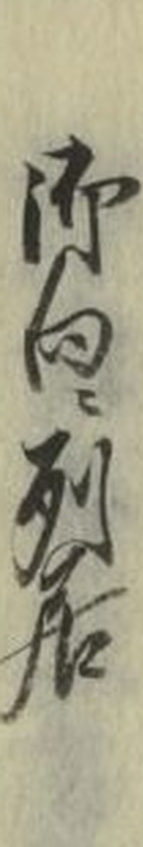御向に列居
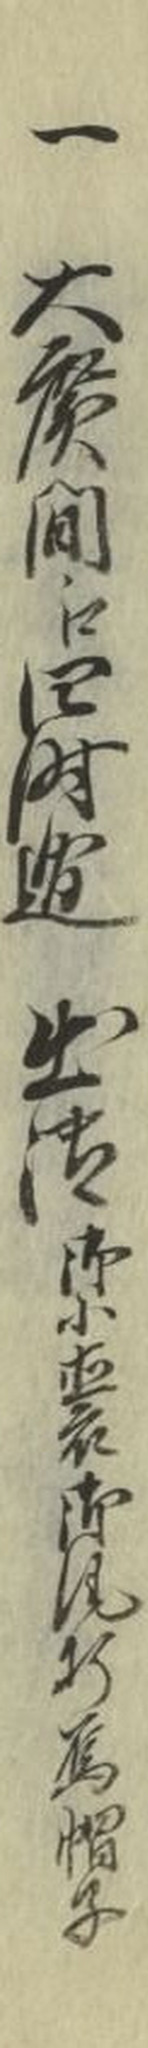一大広間え四時遁出御御小直衣御風折烏帽子
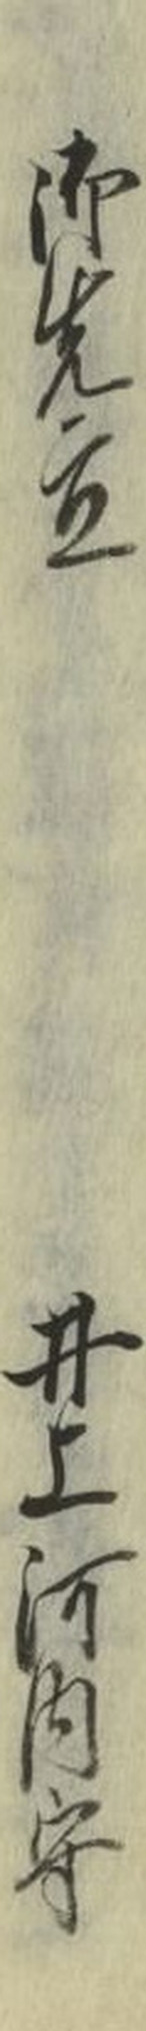御先立井上河内守
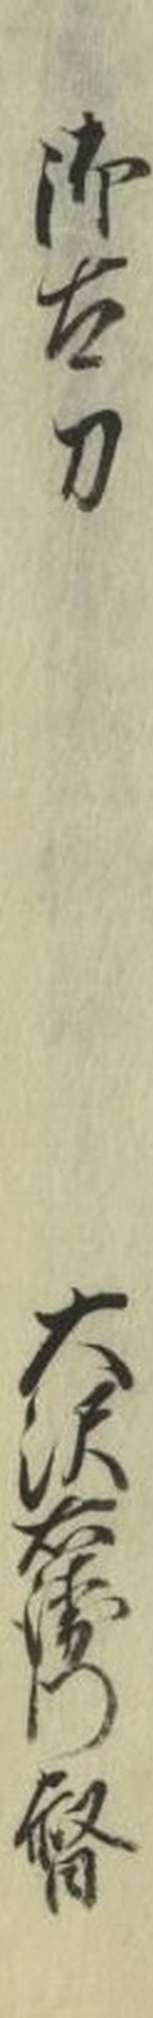御太刀大沢右衛門督
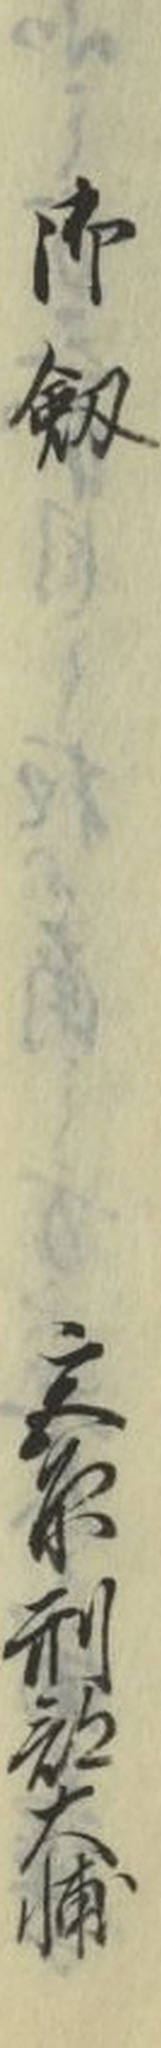御釼宮原刑部大輔
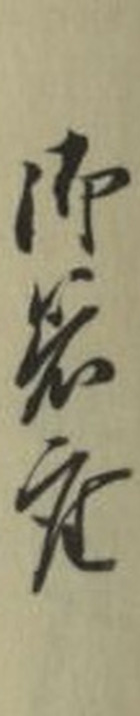御着座
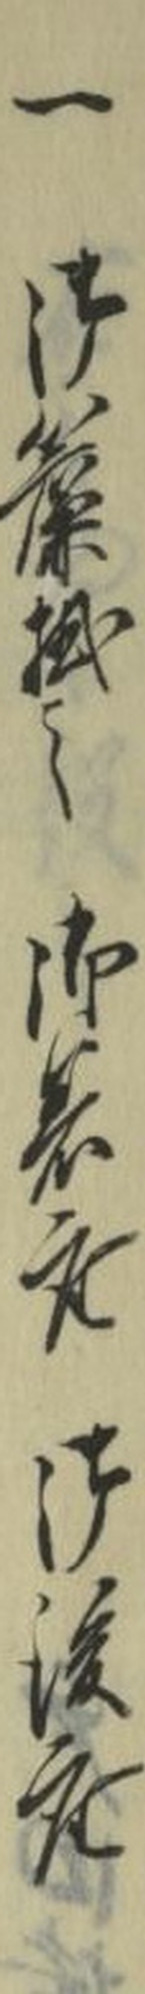一御簾掛之御着座御後座
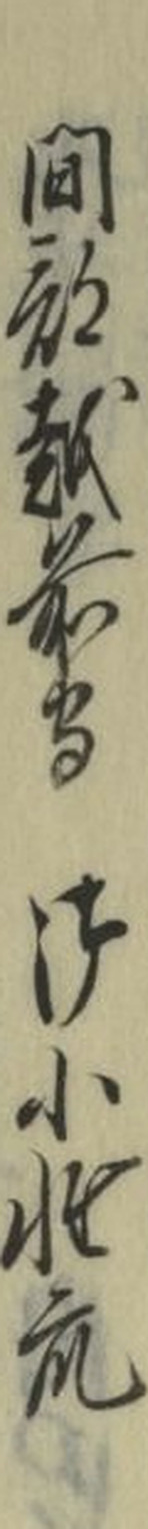間部越前守御小性衆
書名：琉球人参府記
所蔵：University of the Ryukyus Library
